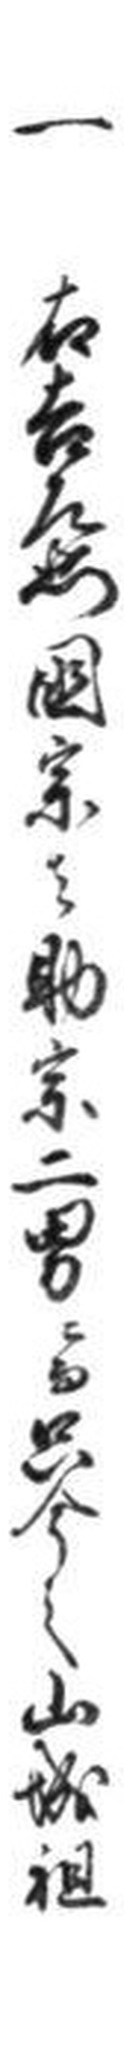一右吉左衛門国宗者助宗二男ニ而只今之山城祖
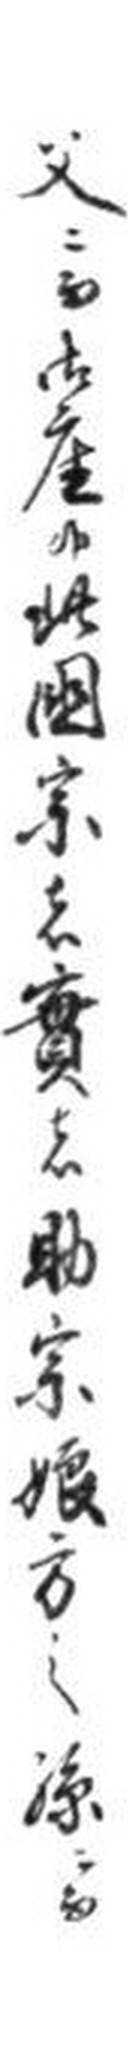父ニ而御座候此国宗者実者助宗娘方之孫ニ而
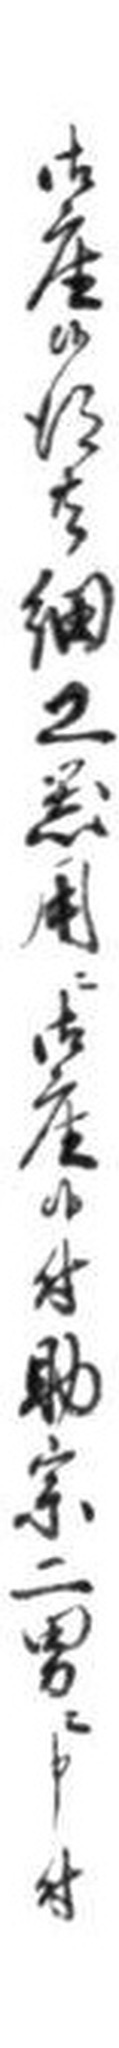御座候得共細工器用ニ御座候付助宗二男ニ申付
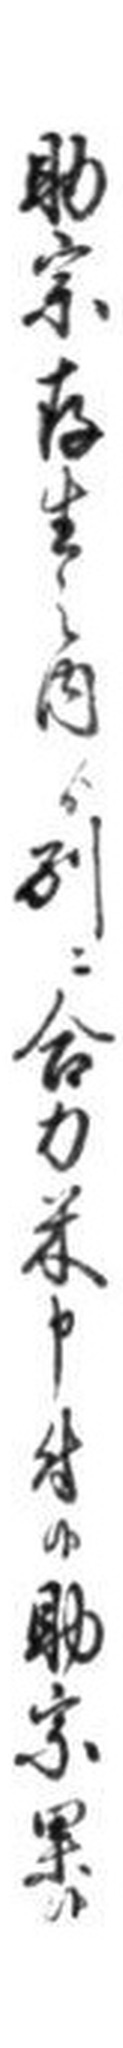助宗存生之内ゟ別ニ合力米申付候助宗果候
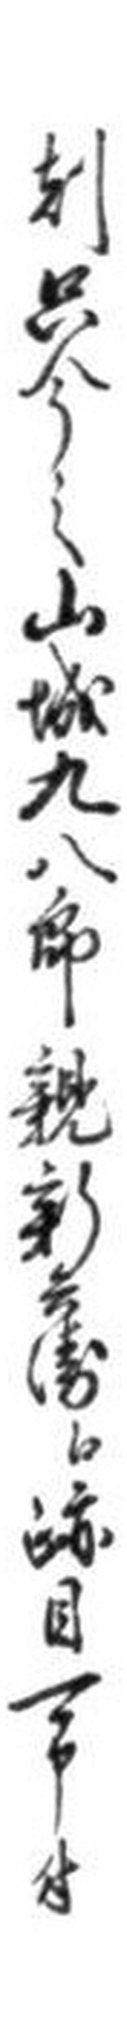刻只今之山城九八郎親新兵衛江跡目可申付
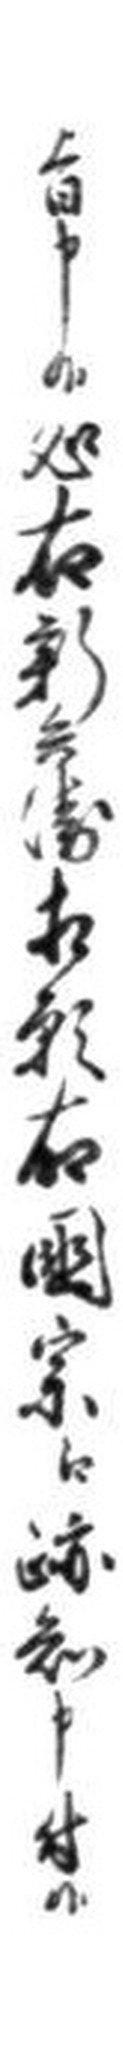旨申候処右新兵衛相願右国宗江跡知申付候
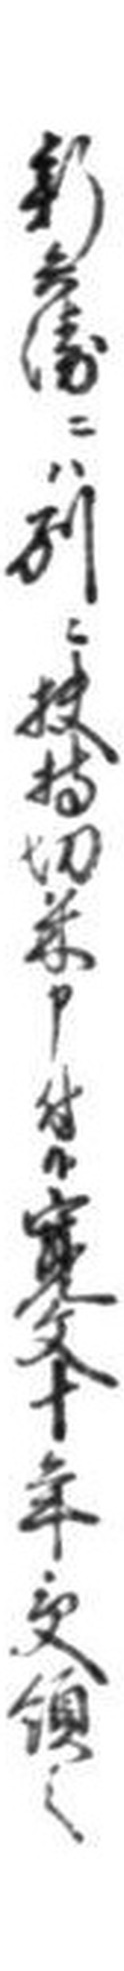新兵衛ニハ別ニ扶持切米申付候寛文十年受領之
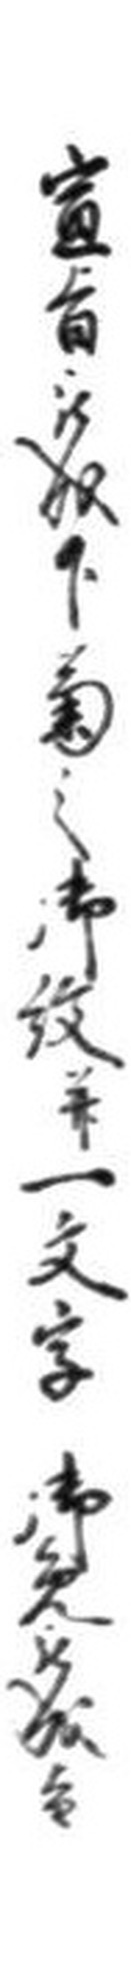宣旨被成下菊之御紋并一文字御免被成旨
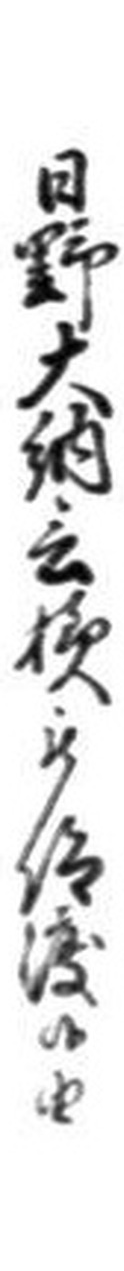日野大納言様被仰渡候由
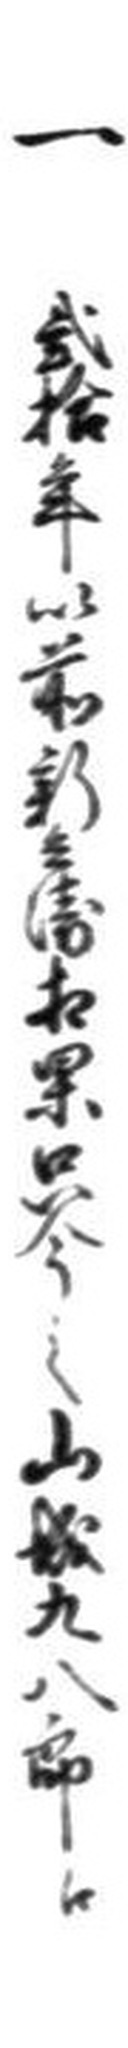一弐拾年以前新兵衛相果只今之山城九八郎江
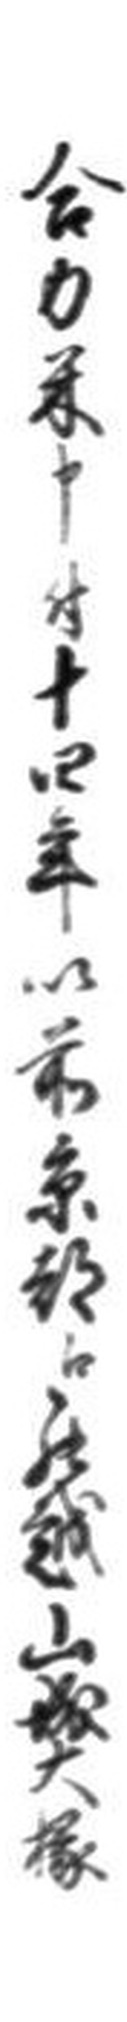合力米申付十四年以前京都江罷越山城大掾
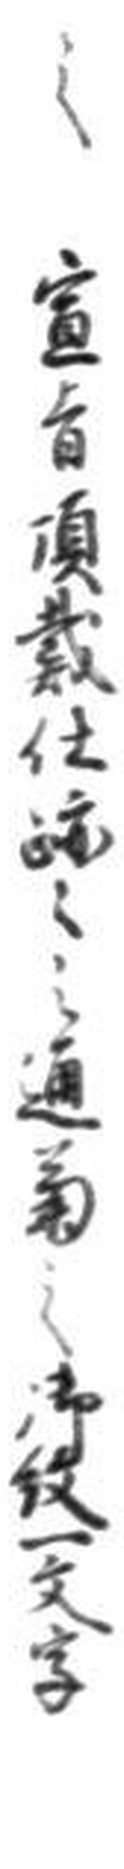之宣旨頂戴仕跡々之通菊之御紋一文字
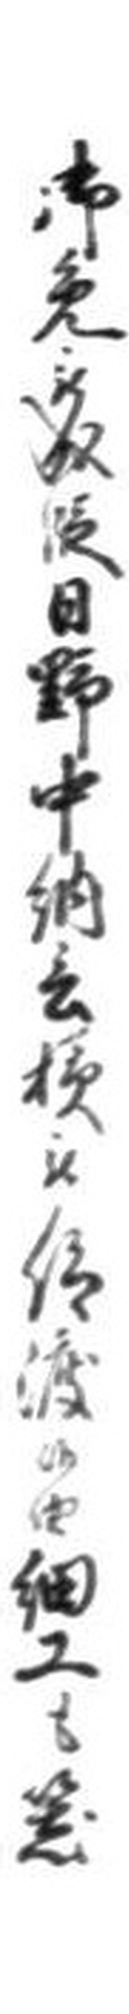御免被成段日野中納言様被仰渡候由細工も器
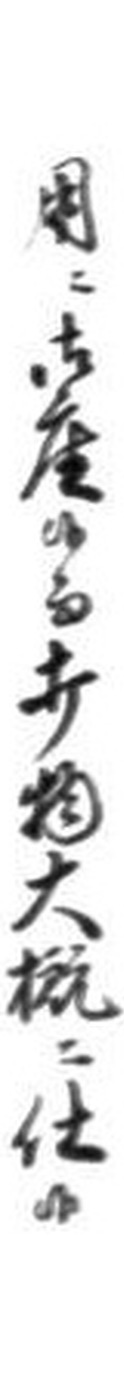用ニ御座候而打物大概ニ仕候
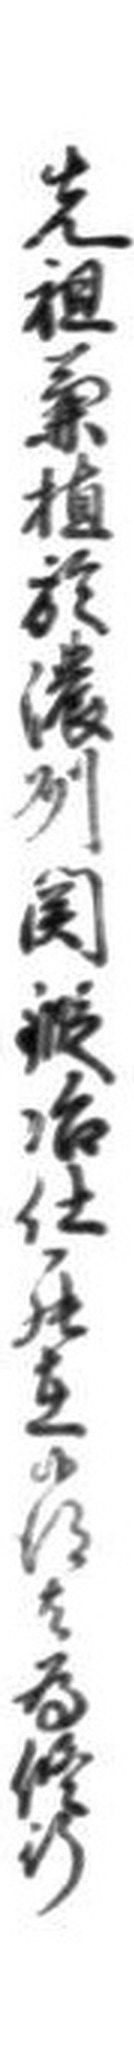先祖兼植於濃州関鍛冶仕罷在候得共為修行

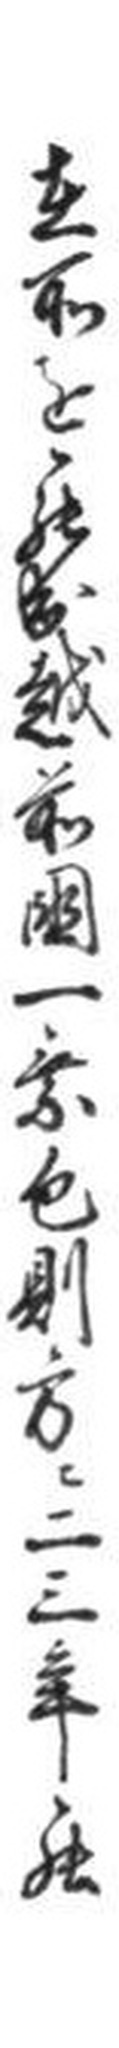在所を罷出越前国一乗包則方ニ二三年罷
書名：家譜 三十三 吉邦公 享保四年
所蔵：福井県文書館 Fukui Prefectural Archives
